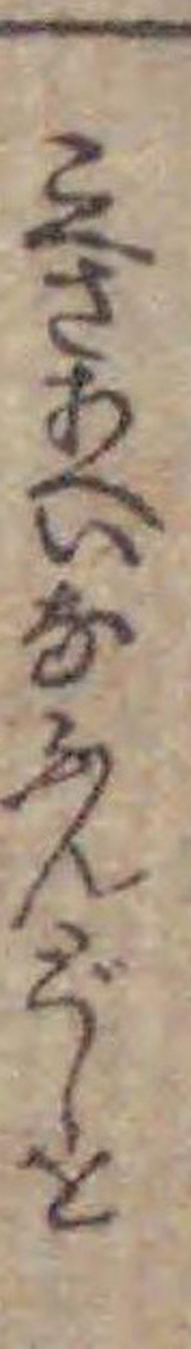こへさあへいなふんどしを
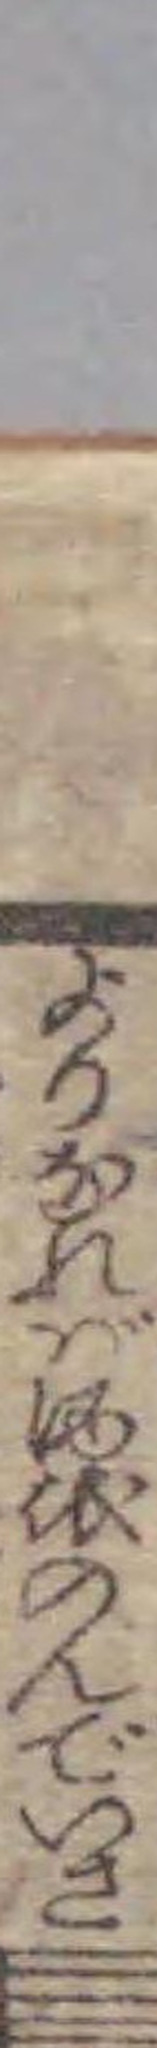よりなれば酒をのんでいさ
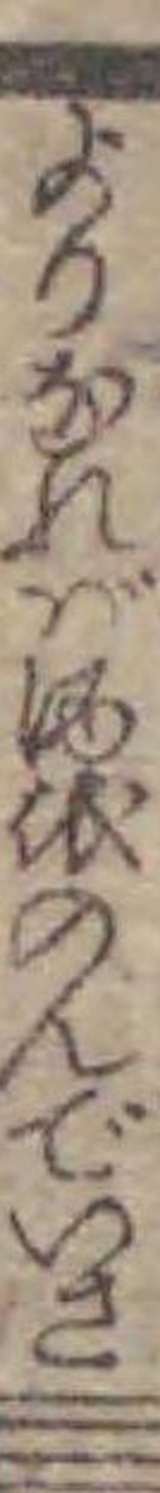よりなれば酒をのんでいさ
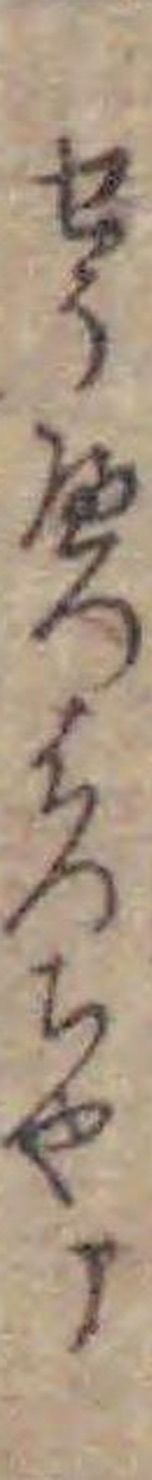せうへつはつちや
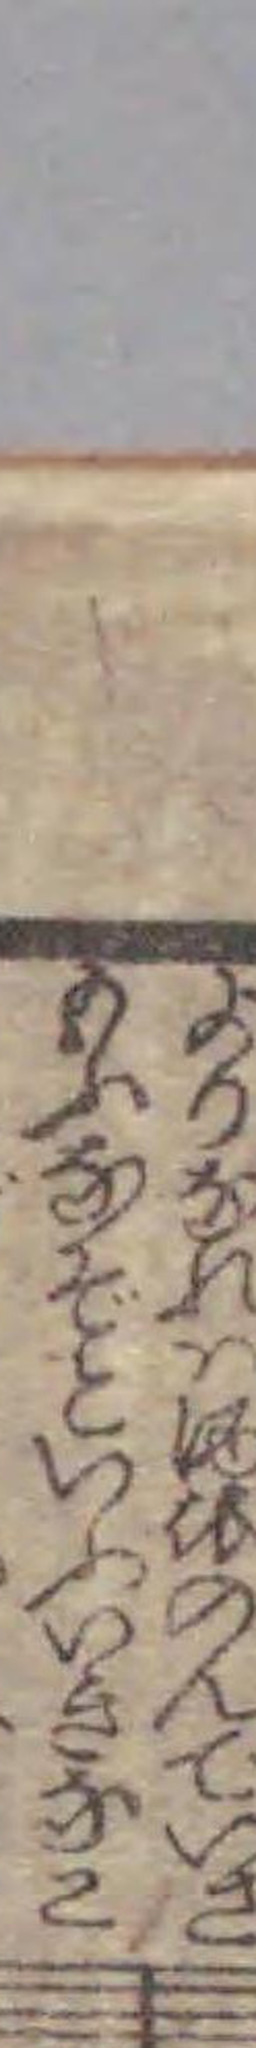もふなぞといふいきなこ
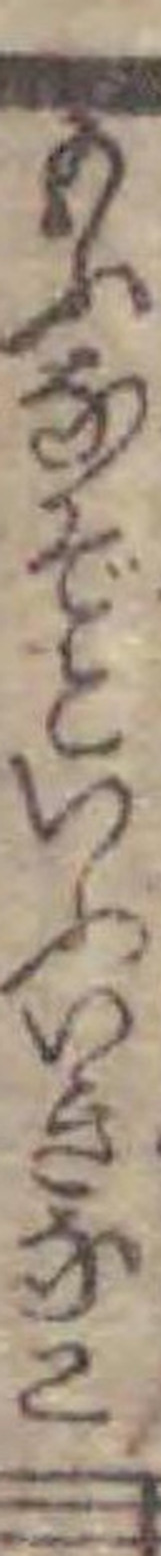もふなぞといふいきなこ
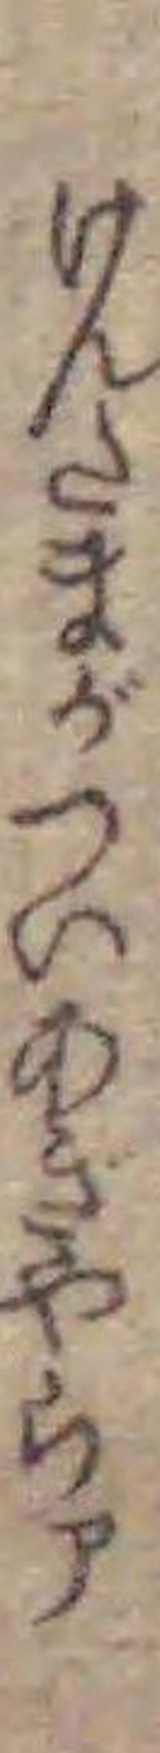けんたまがついあぎやら
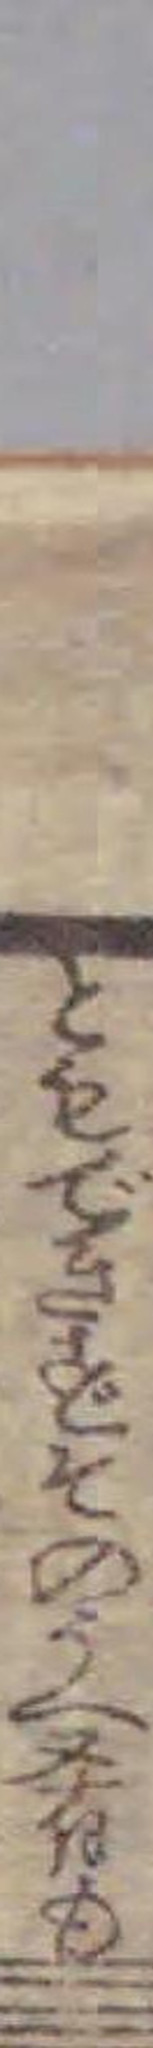ともできずそのうへ肴も
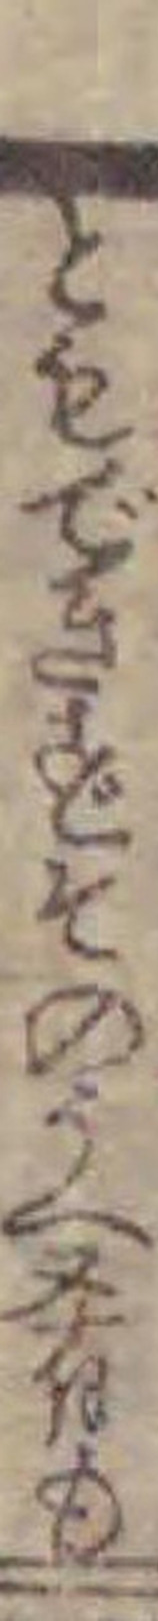ともできずそのうへ肴も
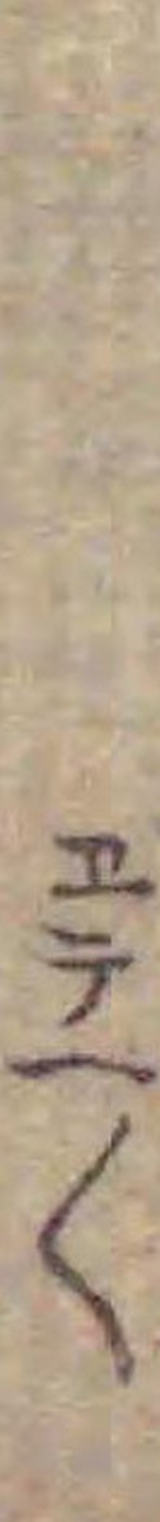ヱテへ〳〵
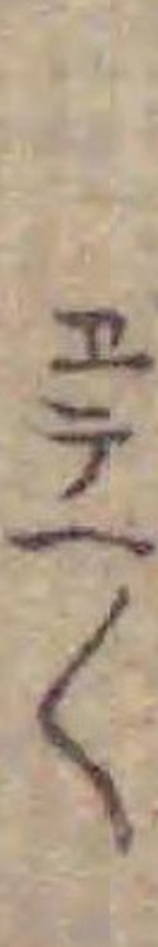ヱテへ〳〵
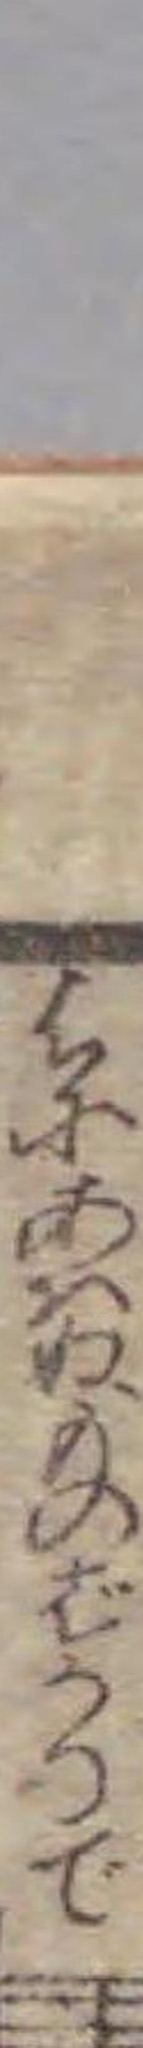はにあはぬものばかりで
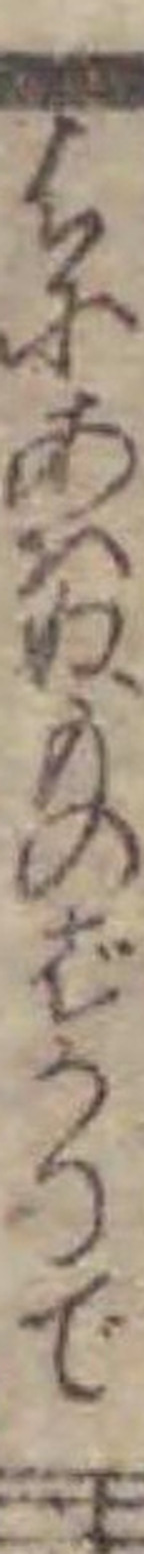はにあはぬものばかりで
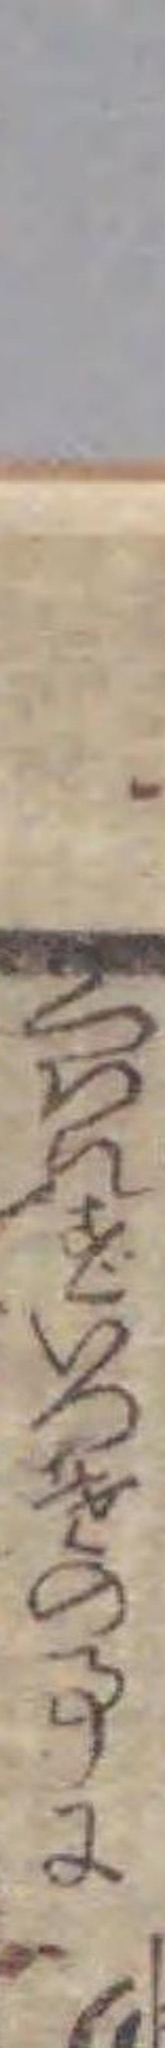くはれずいつその事に
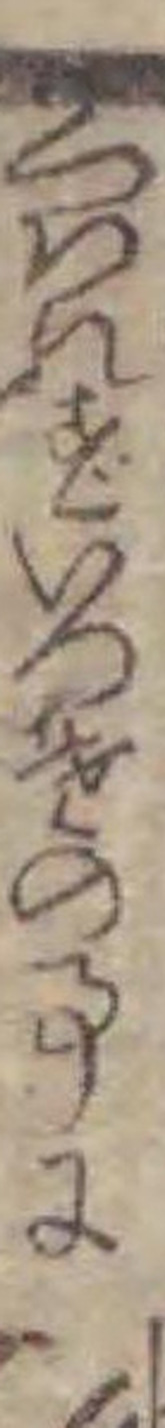くはれずいつその事に
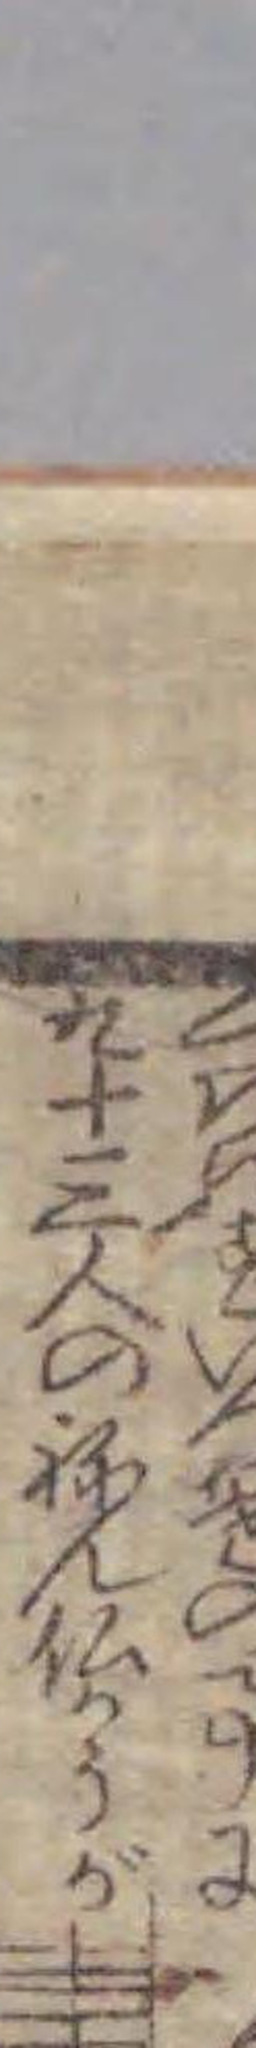九十三人のねん仏かうが
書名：年寄之冷水曽我 : 3巻
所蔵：国立国会図書館 National Diet Library, JAPAN
